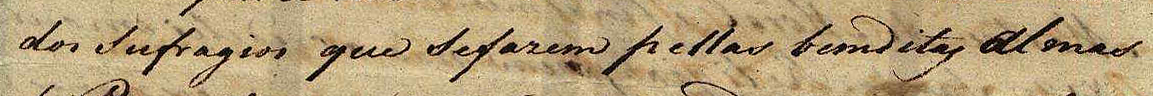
dos sufragios que se fazem pellas bemditas almas
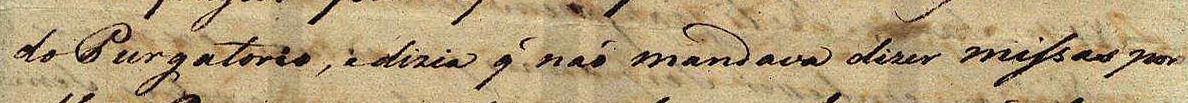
do Purgatorio, e dizia q̄ naõ mandava dizer missas por
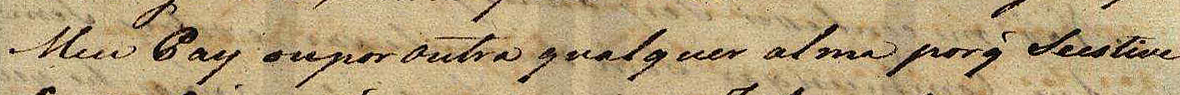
Meu Pay ou por outra qualquer alma porq̄ se estive
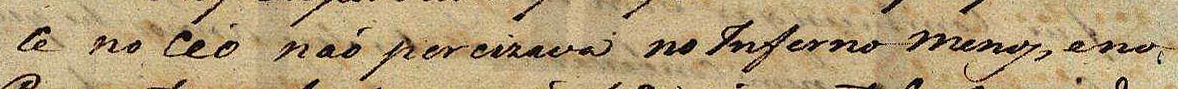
ce no ceo naõ percizava no Inferno menos, e no
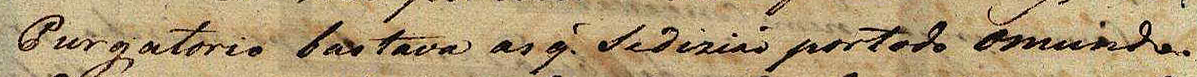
Purgatorio bastava as q̄ se deziaõ por todo o mundo.
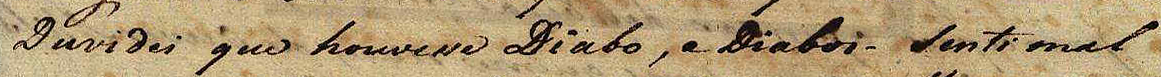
Duvidei que houvesse Diabo, e Diabos. Senti mal
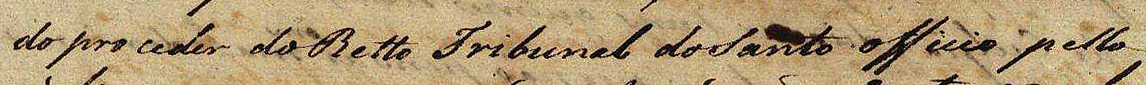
do proceder do Retto Tribunal do Santo officio pello
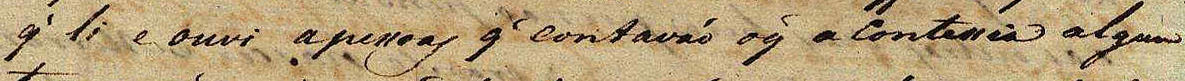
q̄ li e ouvi a pessoas q̄ contavaõ o q̄ acontessia algum
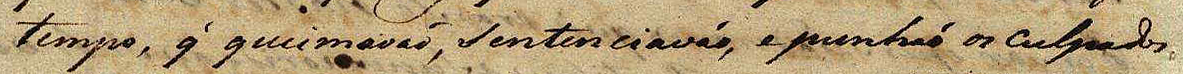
tempo, q̄ queimavaõ, sentenciavaõ, e punhaõ os culpados,
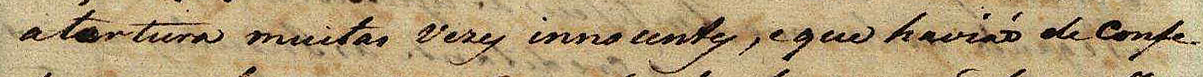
a tortura muitas vezes innocentes, e que haviaõ de confe
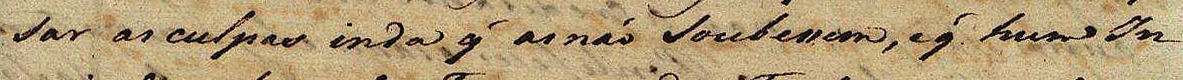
sar as culpas inda q̄ as naõ soubessem, e q̄ hum In
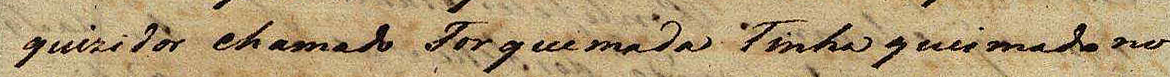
quizidor chamado Torquemada tinha queimado no
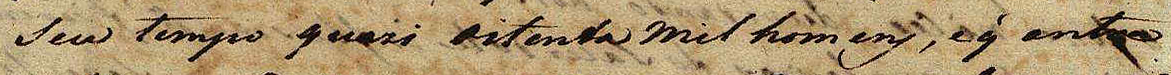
seu tempo quazi oitenta mil homens, e q̄ ante
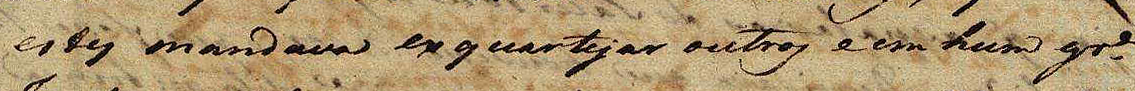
estes mandava exquartejar outros e em hum gr.e
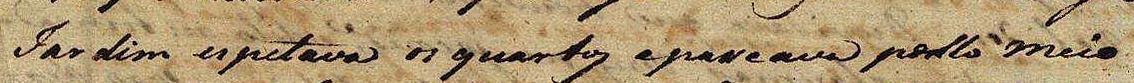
Iardim espetava os quartos e passeava pello meio
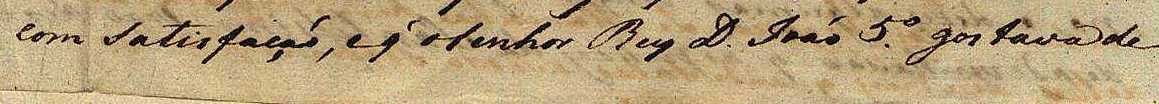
com satisfaçaõ, e q̄ o senhor Rey D. Ioaõ 5.o gostava de
